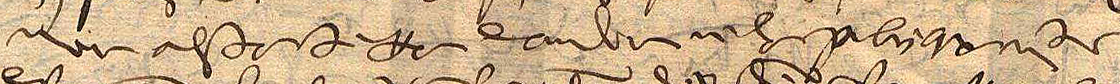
nou a sta teRa e andou nele pobriquamte
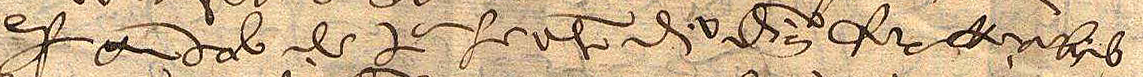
e ꝑḡutado ele ta se o ħo dio dias̄ fora Reçebido
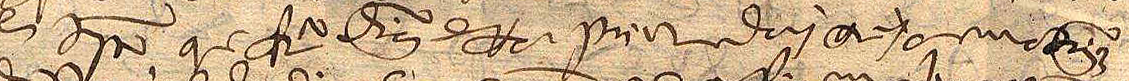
en tp̄o que frco dias̄ eRa prior da jgreja matriz̄
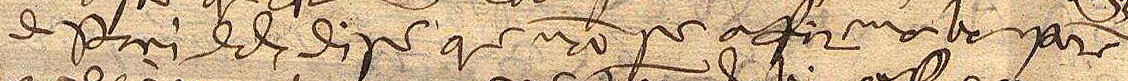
desta çidade dise qe nõ se afirmaVa porē
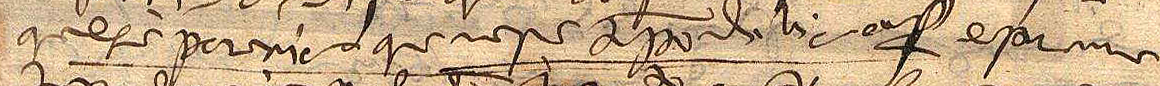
que lhe pareçia que noso tp̄o devia o ꞩ e prome
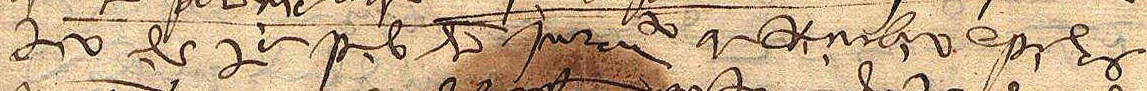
teo ele ta pelo ħo juramto q̄ Reçebeo e pelas
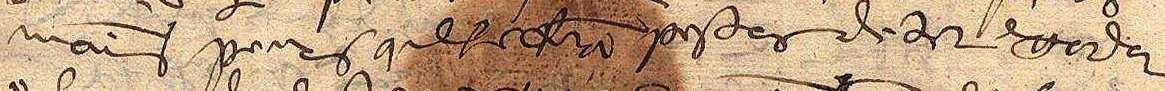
mais prouas que lhe forão postas de ter e gardar
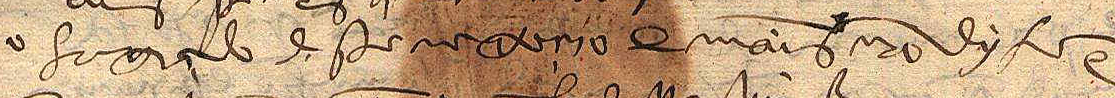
o segredo deste negoçio e m̄ais não dyse e
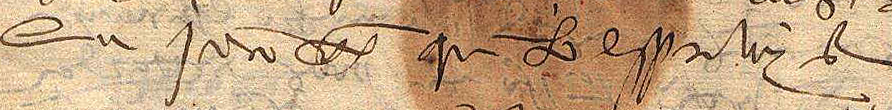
Eu João ḡz que ho esprevy
